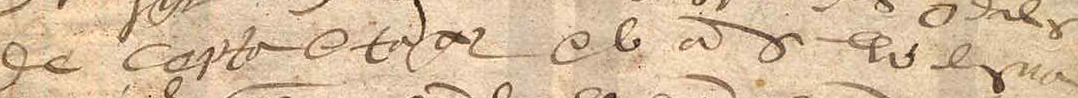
de cepta e tāger e do c̄oselho de sua
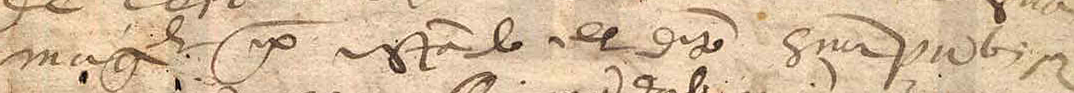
magde c̄ꝭ estādo elle dito Snōr provisor
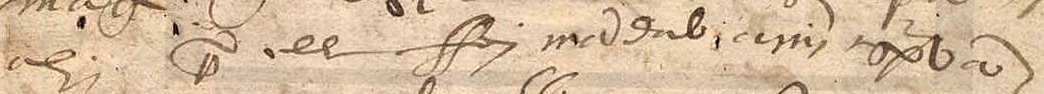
ahj p̄o elle ffoy mādado a mj̄ esp̄vão
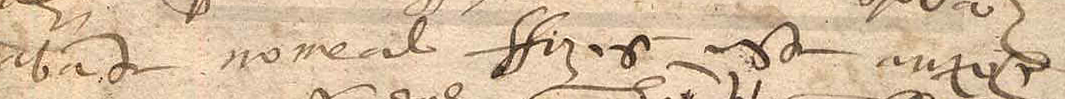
avāte nomeado ffizese este auto ē
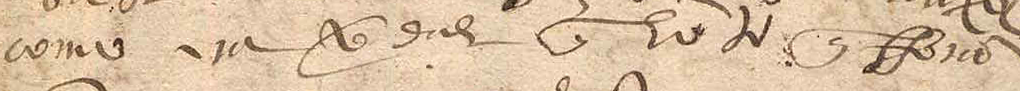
como era ꝟdade q̄ hōtē q̄ fforão
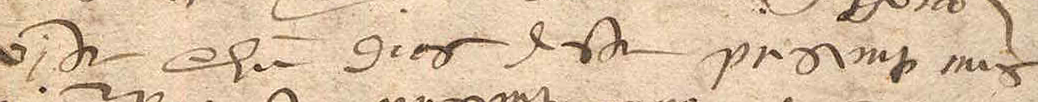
vj̄te e hū dias deste presemte mes
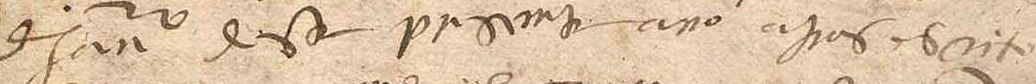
de Janro deste presemte ano atras escrito
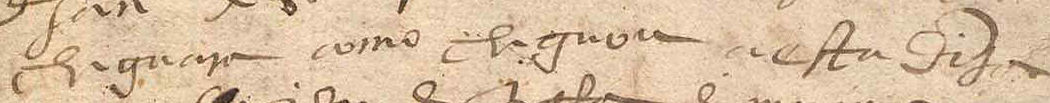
cheguara como chegou a esta dita
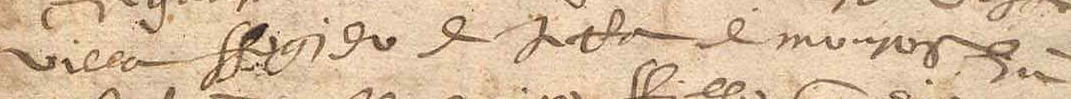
villa ffogido de teRa de mouros hū
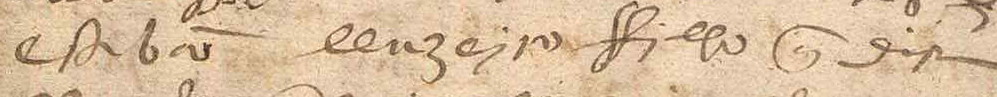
estevão lluzejro ffilho q̄ dise
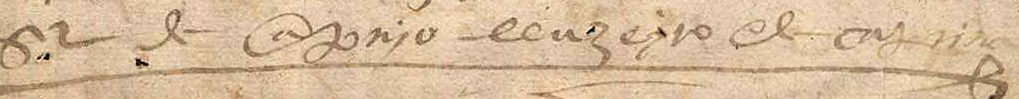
ser de ātonjo lluzeyro e de caterina
